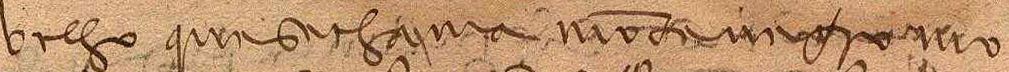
velho que se chama mōtenegro mo
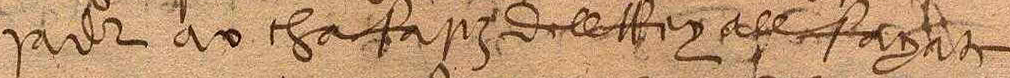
rador ao chafariz dell Rey allfayate
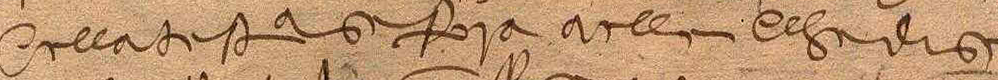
e ella testa se fora a elle e lhe dise
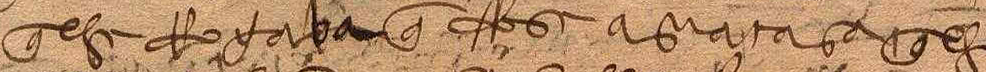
q̄ lhe Rogava q̄ ffose a sua casa q̄ lhe
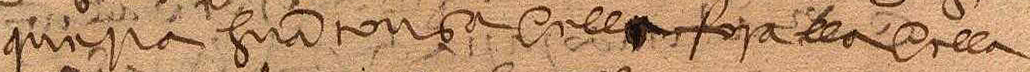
queria huā cousa e elle fora lla e ella
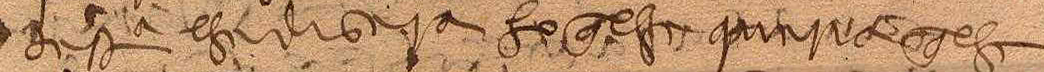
testa lhe disera ho q̄ lhe queria q̄ lhe
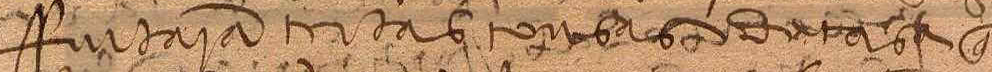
ffurtarā certas cousas de casa q̄
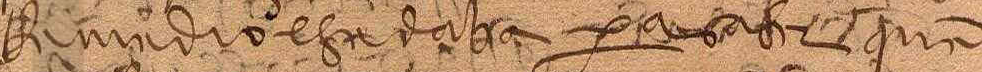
Remedio lhe dava ꝑa saber quē
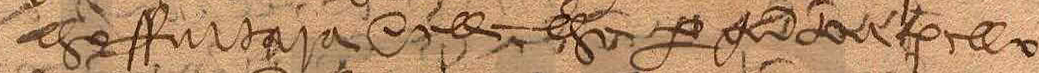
lho ffurtara e elle lhe ꝑgūtou pello
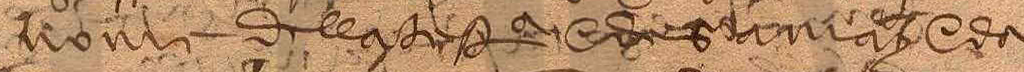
nome della testa e de sua may e da
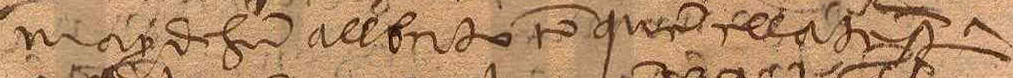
may de hū allberto cō quē ella testa
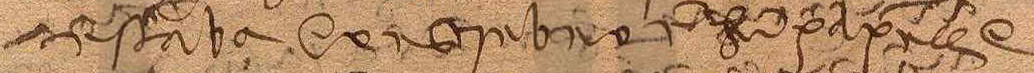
estava e o escreveo ē hū papell e
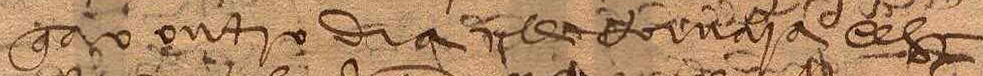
q̄ ao outro dia elle tornara e lhe
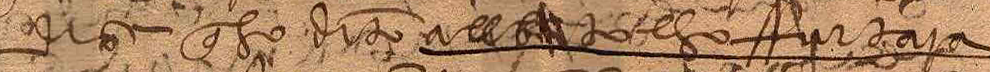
dise q̄ ho dito allberto lho ffurtara
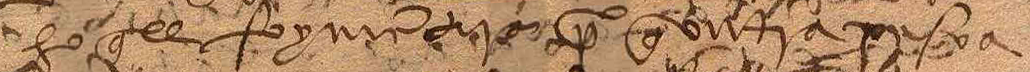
ho q̄ll foy mētira p̄oq̄ outra pesoa
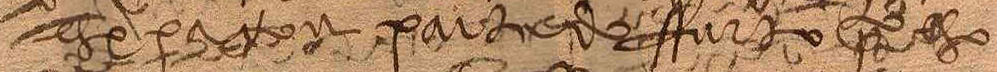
lhe pagou parte de ffurto p̄o lho
